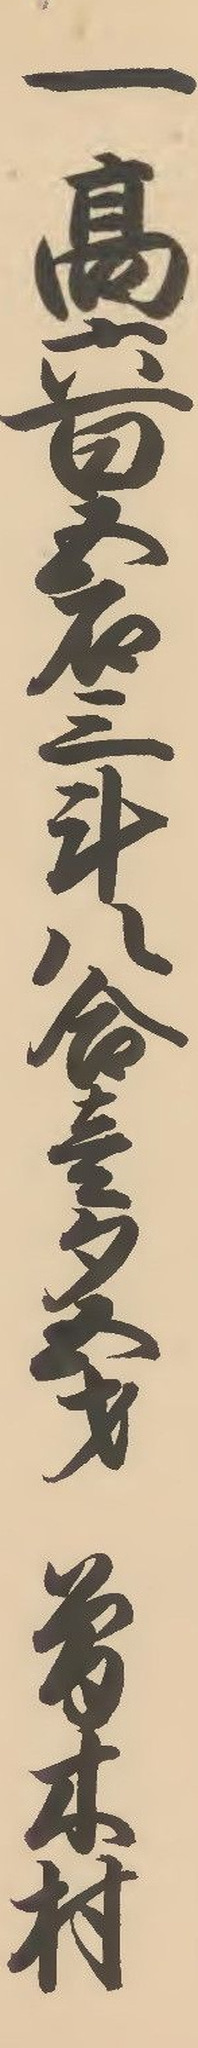一髙六百五石三斗八合壱夕五才曽木村
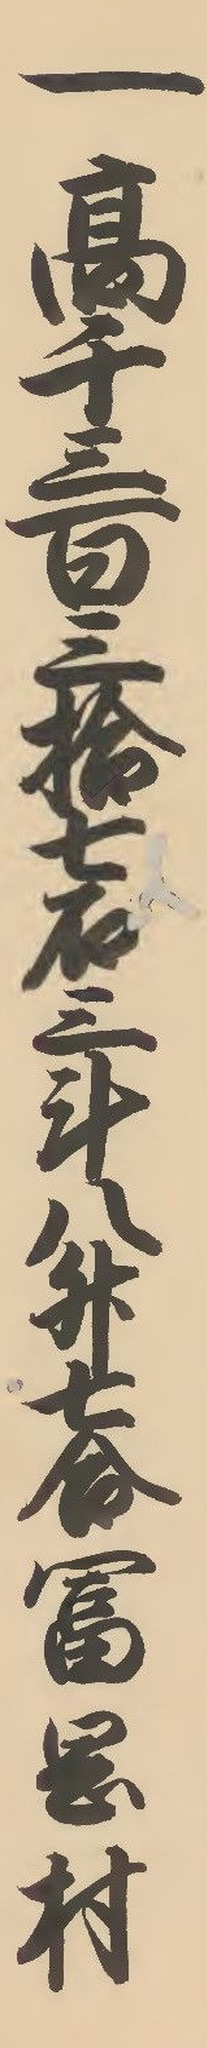一髙千三百三拾七石三斗八升七合冨岡村
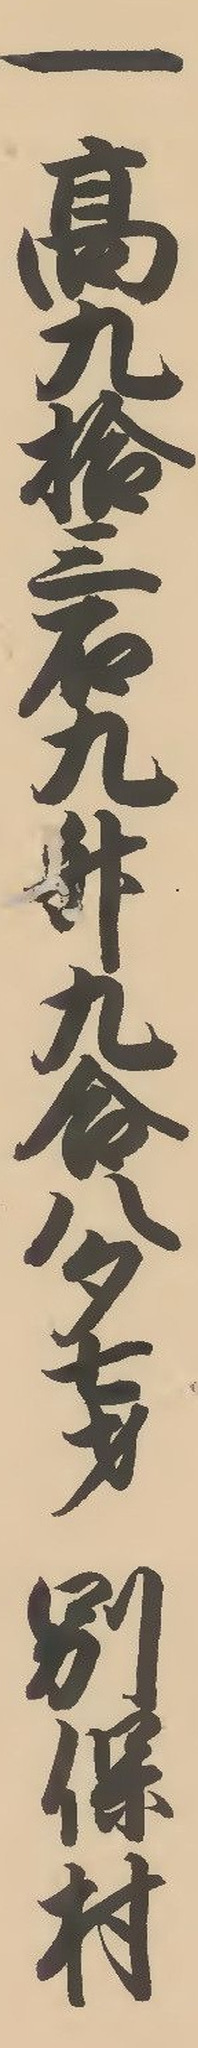一髙九拾三石九升九合八夕七才別保村
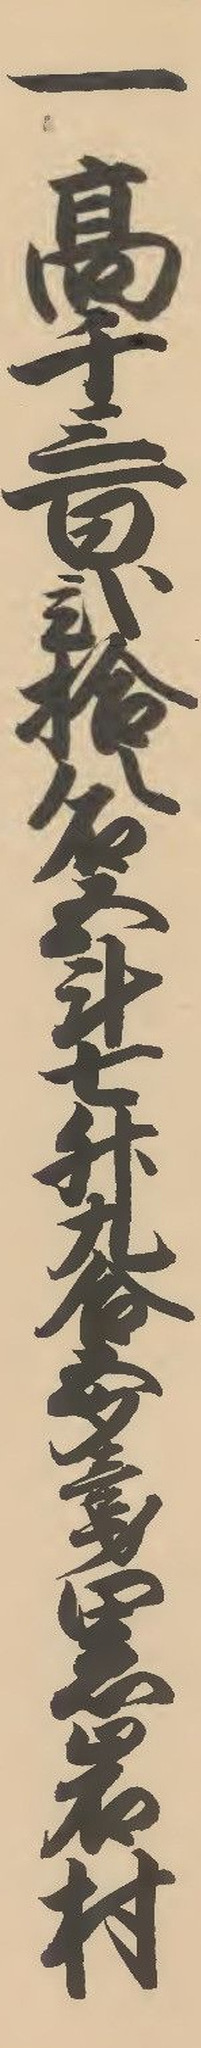一髙千三百弐拾八石五斗七升九合五夕壱才
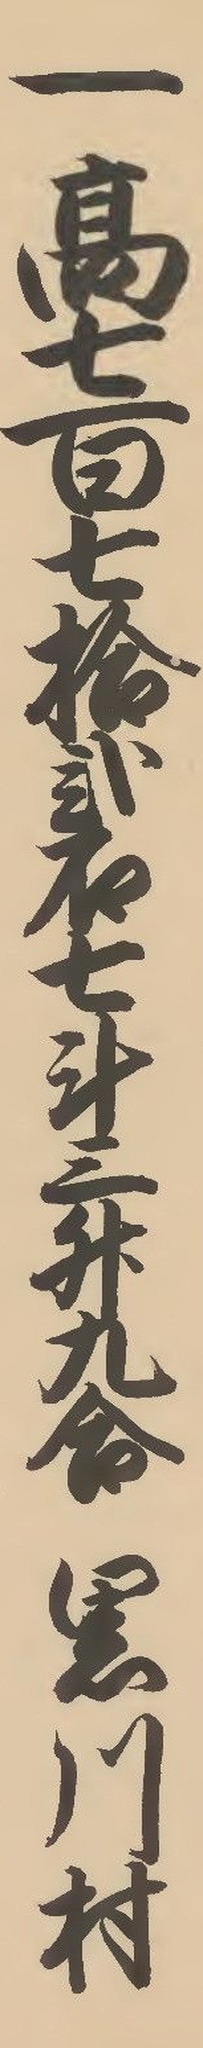一髙七百七拾弐石七斗三升九合黑川村
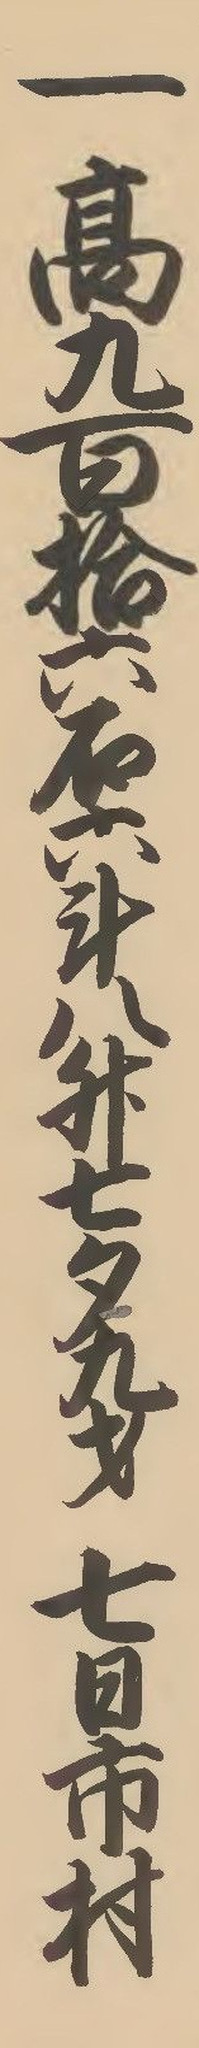一髙九百拾六石六斗八升七夕九才七日市村

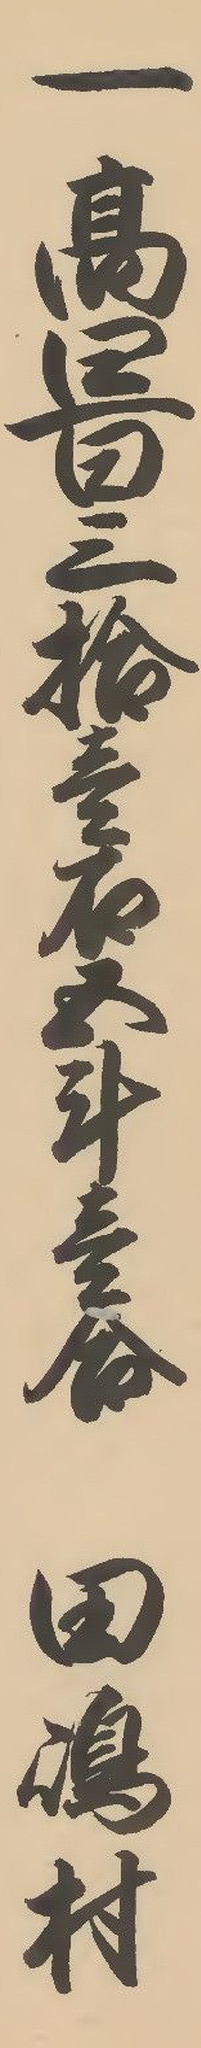一髙四百三拾壱石五斗壱合田嶋村
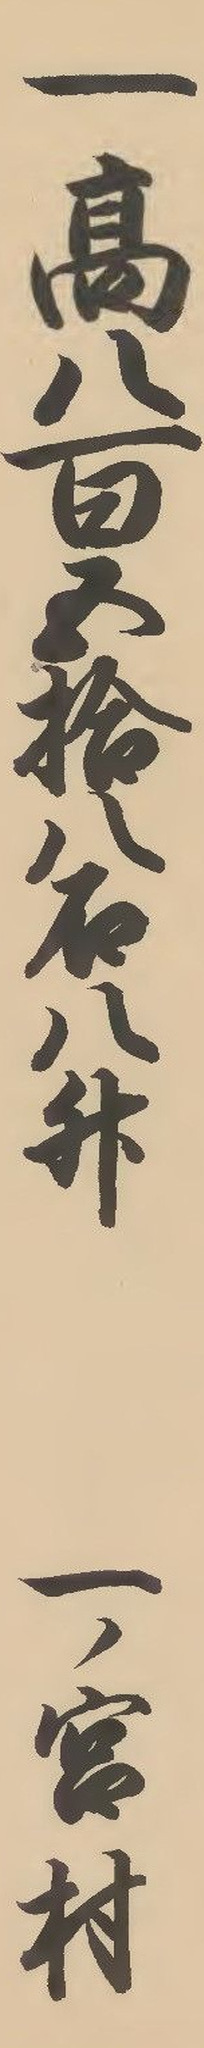一髙八百五拾八石八升一ノ宮村
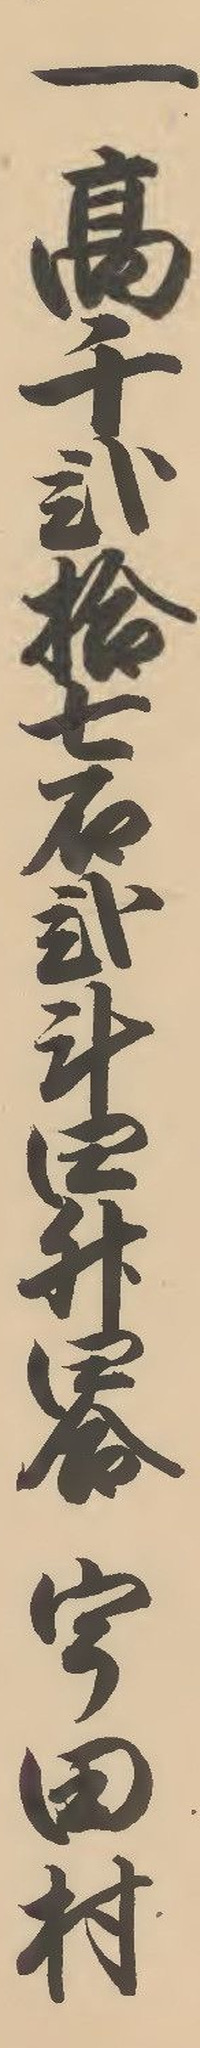一髙千二拾七石弐斗四升四合宇田村
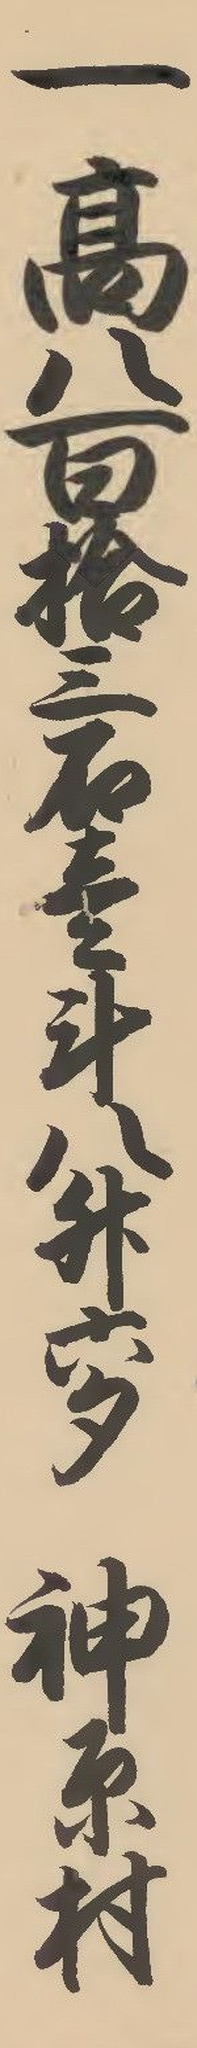一髙八百拾三石壱斗八升六夕神原村
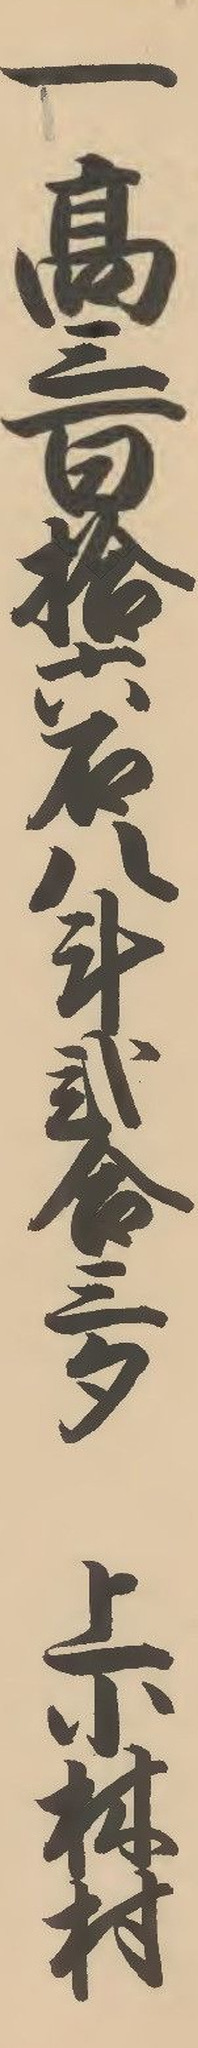一髙三百拾六石八斗弐合三夕上小林村
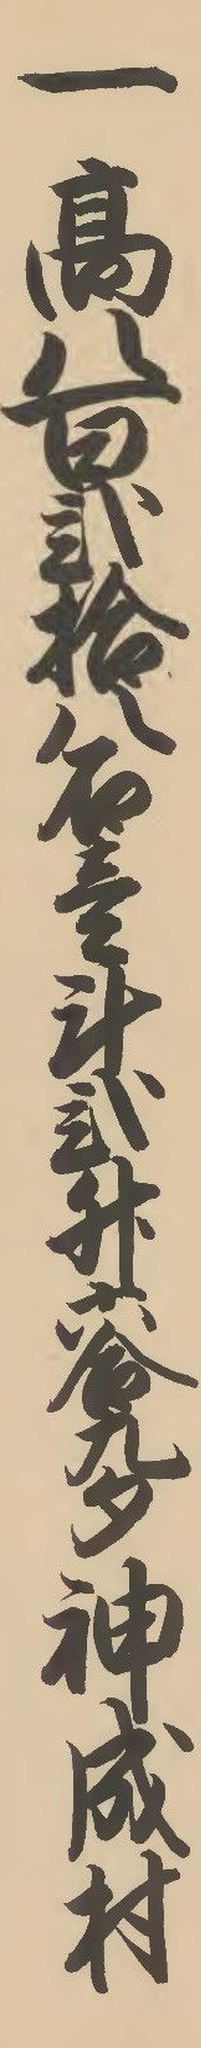一髙八百弐拾八石壱斗弐升六合九夕神成村
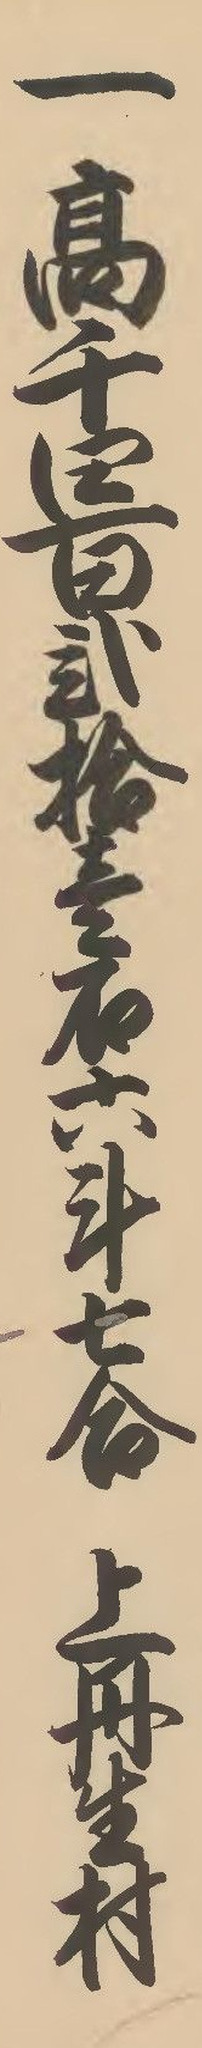一髙千四百弐拾壱石六斗七合上丹生村

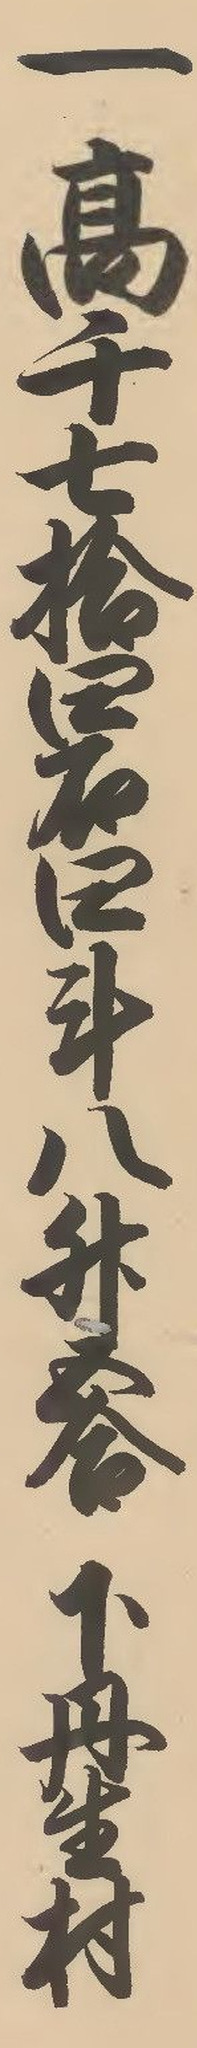一髙千七拾四石四斗八升五合下丹生村
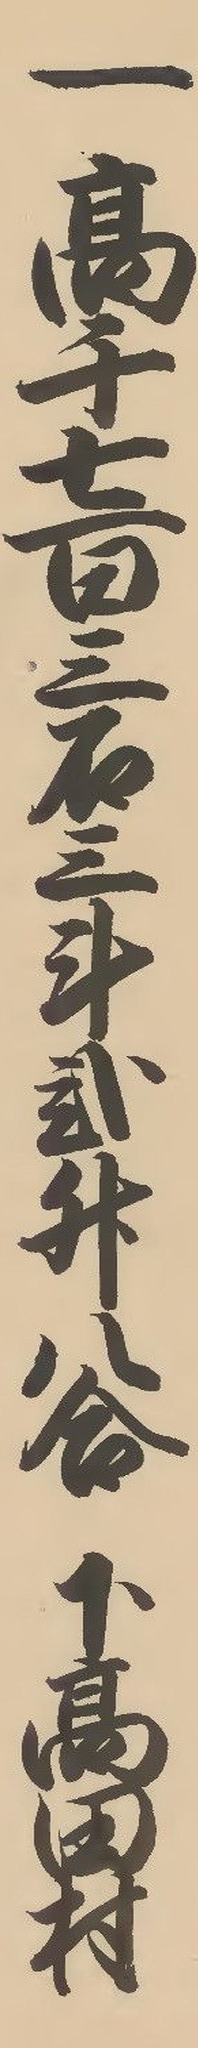一髙千七百三石三斗弐升八合下髙田村
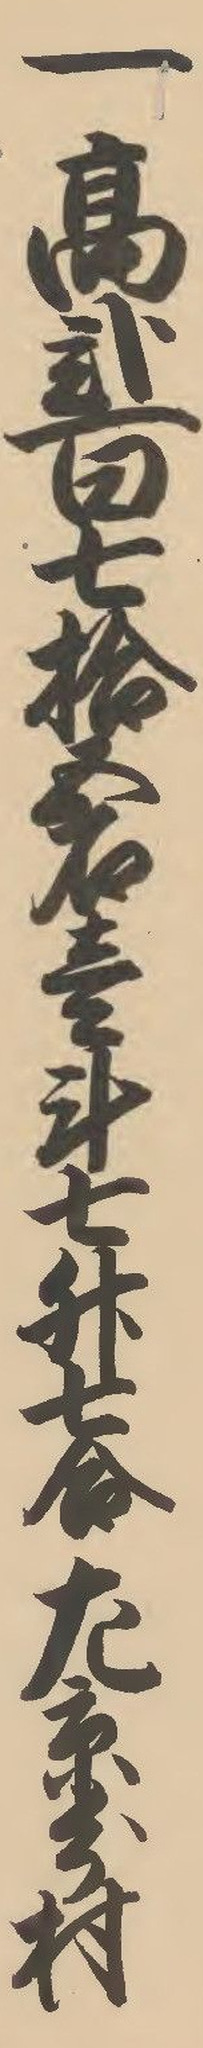一髙弐百七拾五石壱斗七升七合左京分村
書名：上野国郷帳
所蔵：国立公文書館 National Archives of Japan
